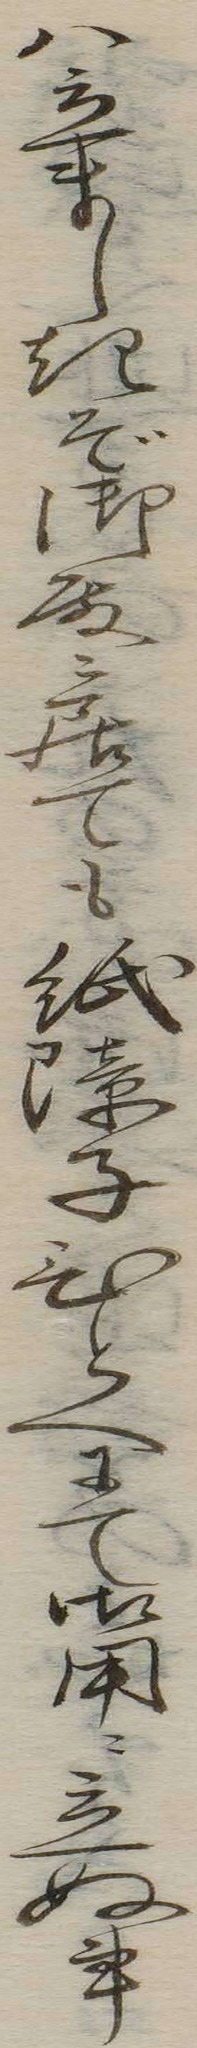は立ましきぞ御殿ニ居ても紙障子ひとへにて御用ニ立ぬ事
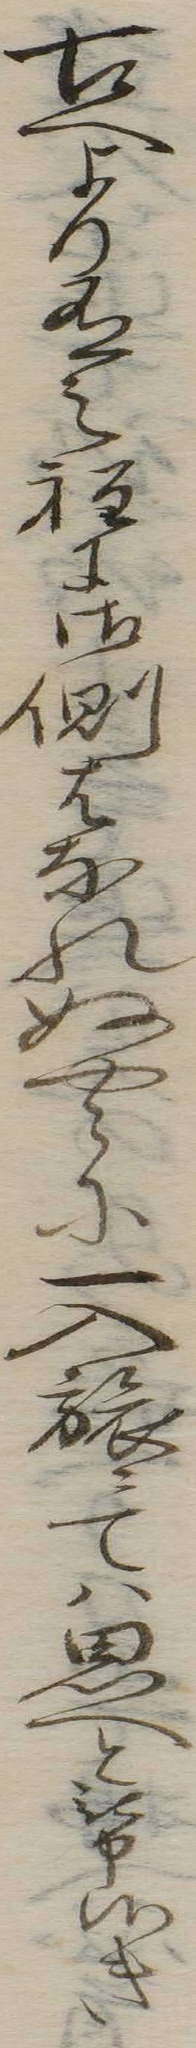古へより有之程に御側はなれぬやうに一入旅ニては思へと被申候き
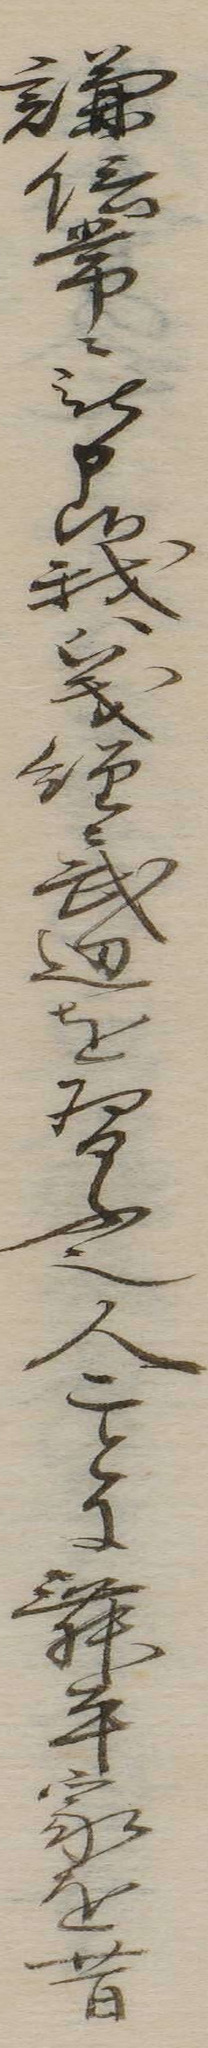一謙信常ニ被申候我は義経ニ武辺を習ふ也人ことに舞平家を昔
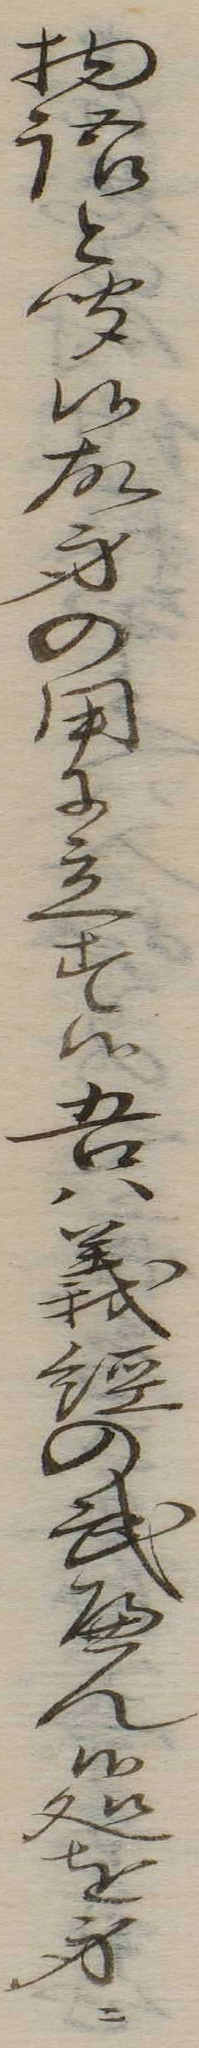物語と聞候故身の用に立す候吾は義経の武へん候処を身ニ
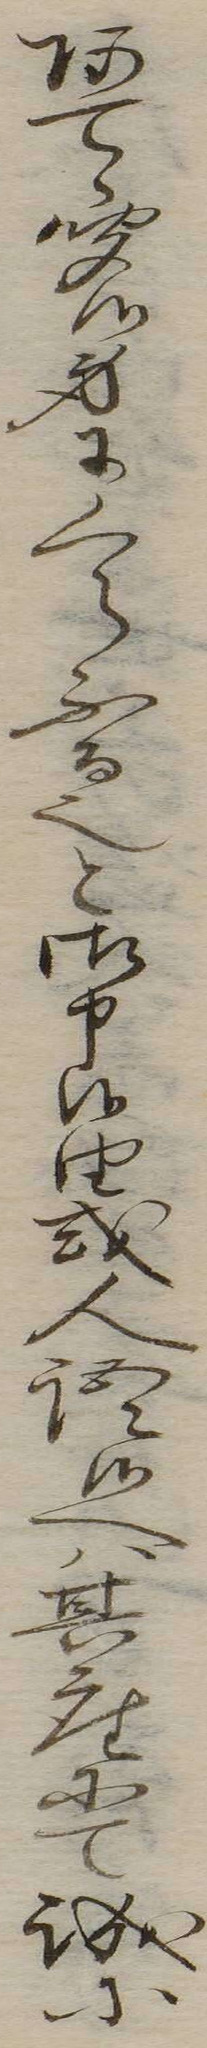あてゝ聞候身にくらふる也と御申候由或人語候へは其座にて誠に
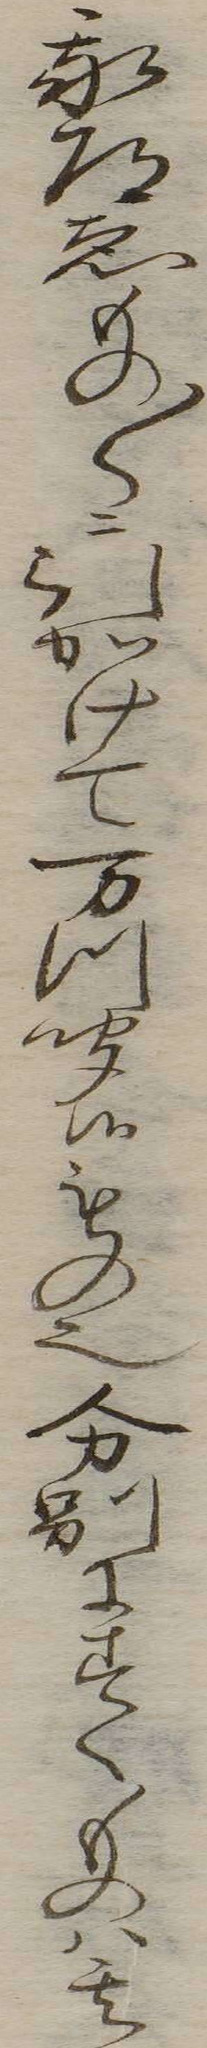我道ゑもの〳〵ニ引かけて万つ聞候もの也分別にすくものは其
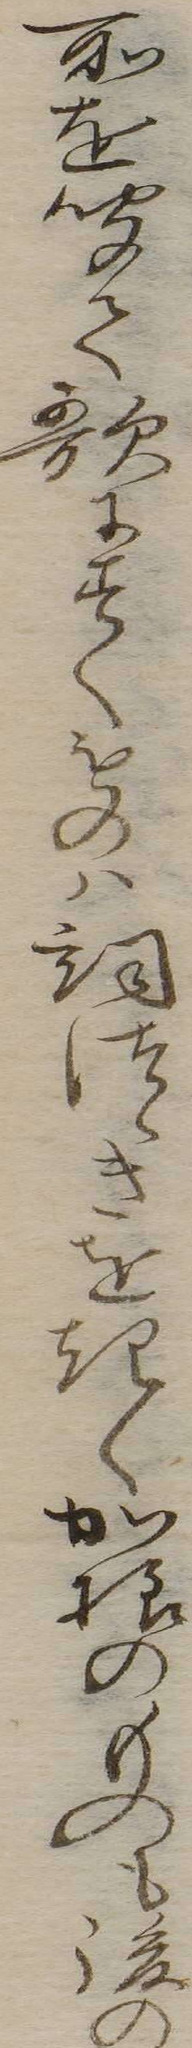所を聞て歌にすくものは詞つゝきをきくか様のものも後の

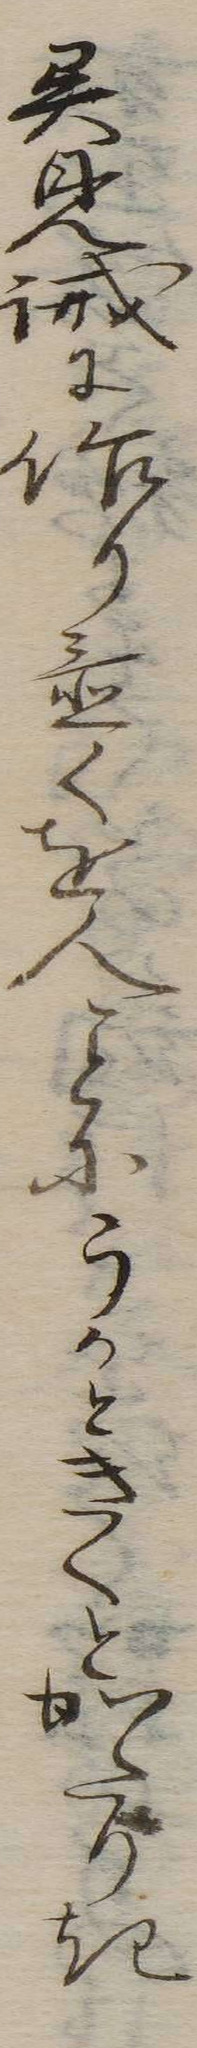異見誡に作り置くを人ことにうかときくとかたりき
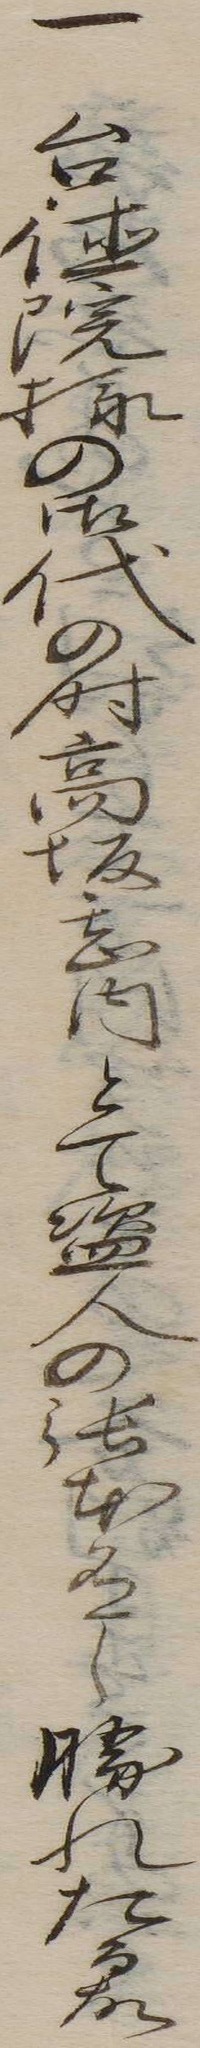一台徳院様の御代の時高坂甚内とて盗人の張本有し勝れたる故
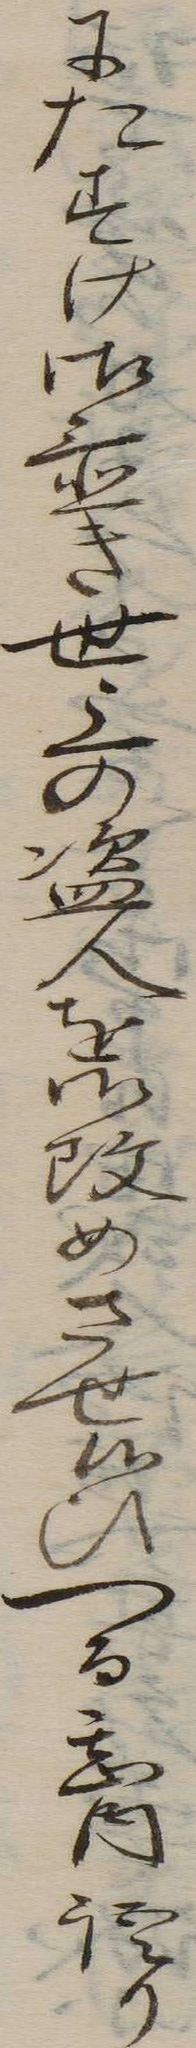にたすけ御置き世上の盗人を御改めさせ候ひつる甚内語り
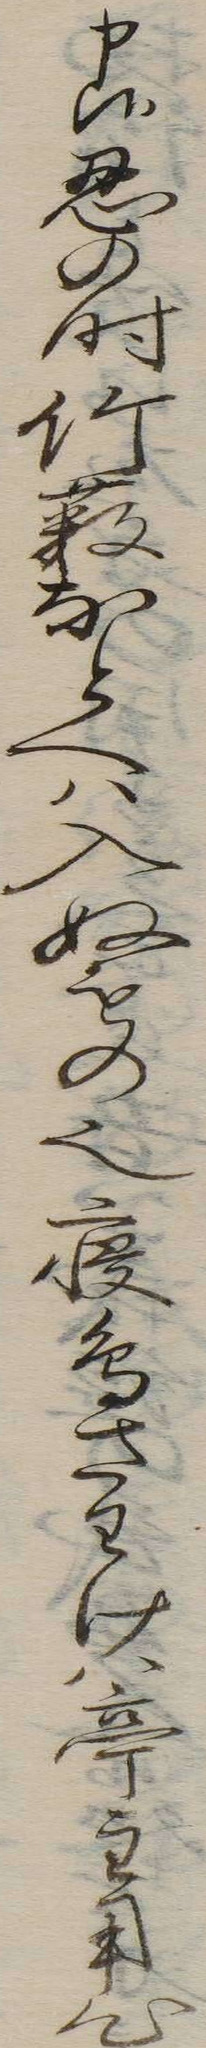申候忍の時竹やぶなとへは入らぬもの也寝鳥さわけは亭主用心
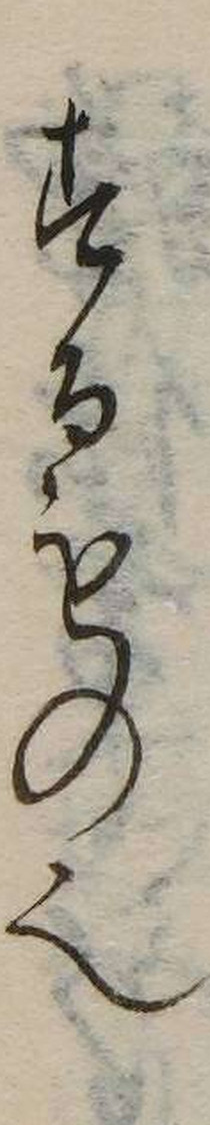するもの也
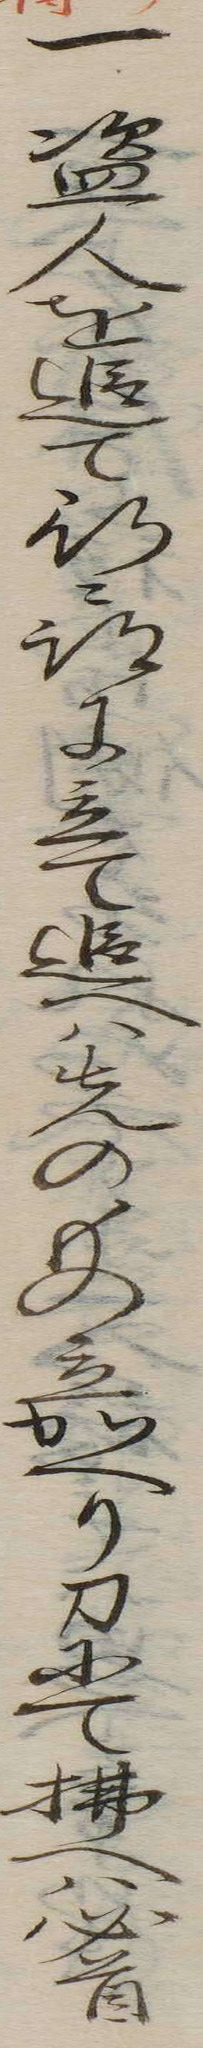一盗人を追て行ニ跡に立て追へは先のもの立かへり刀にて払へは必首
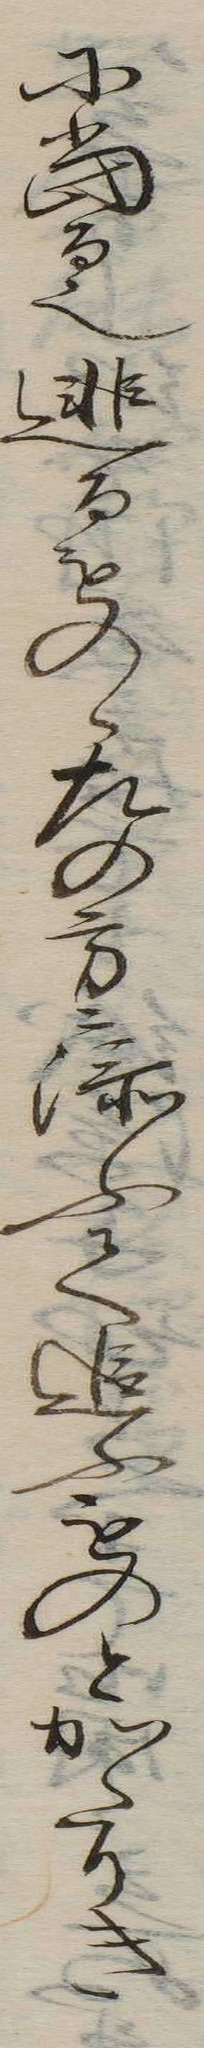に当る也逃るものゝ左の方ニ添ふて追ふものとかたりき
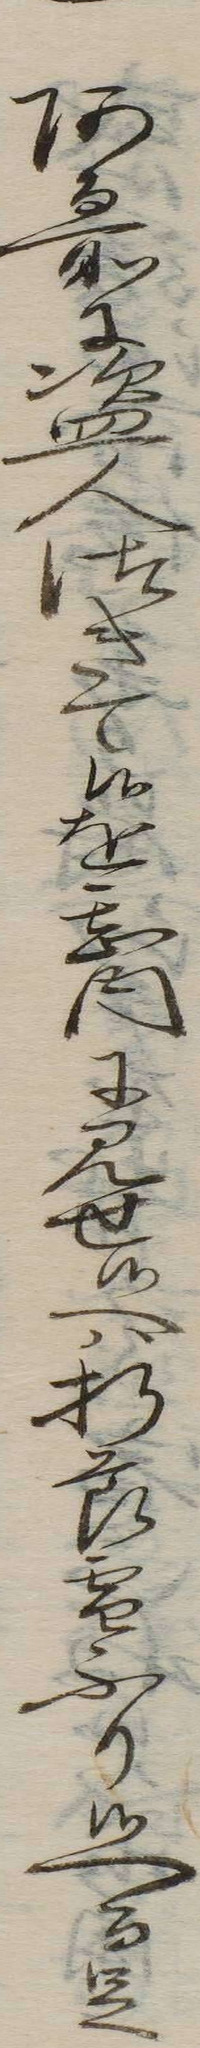一ある所に盗人つきて候を甚内に見せ候へは折節雪ふり候つる足
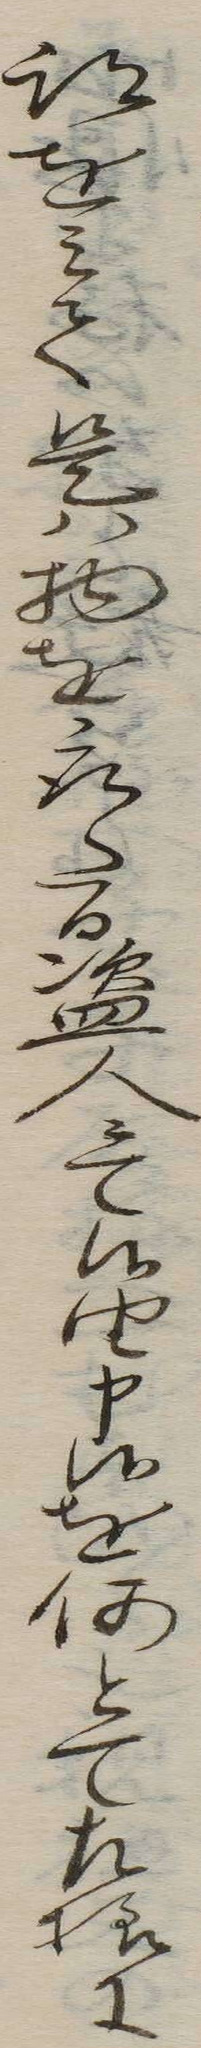跡をみて是は物を取たる盗人ニて候由申候を何とて左様に
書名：三河之物語
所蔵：国文学研究資料館
